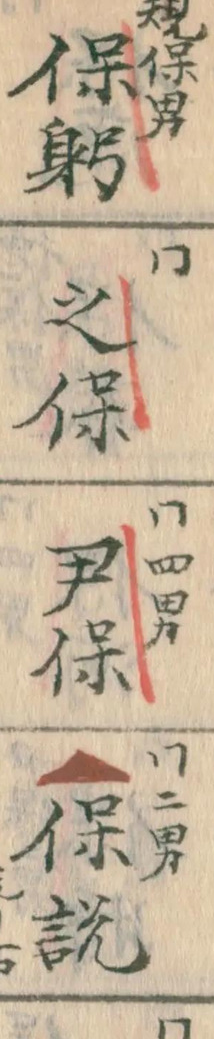保躬之保尹保▲保説
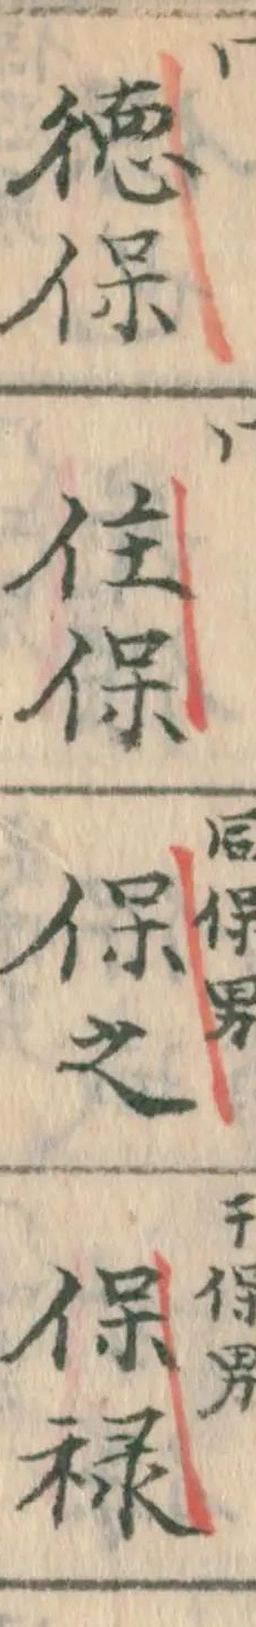徳保住保保之保禄

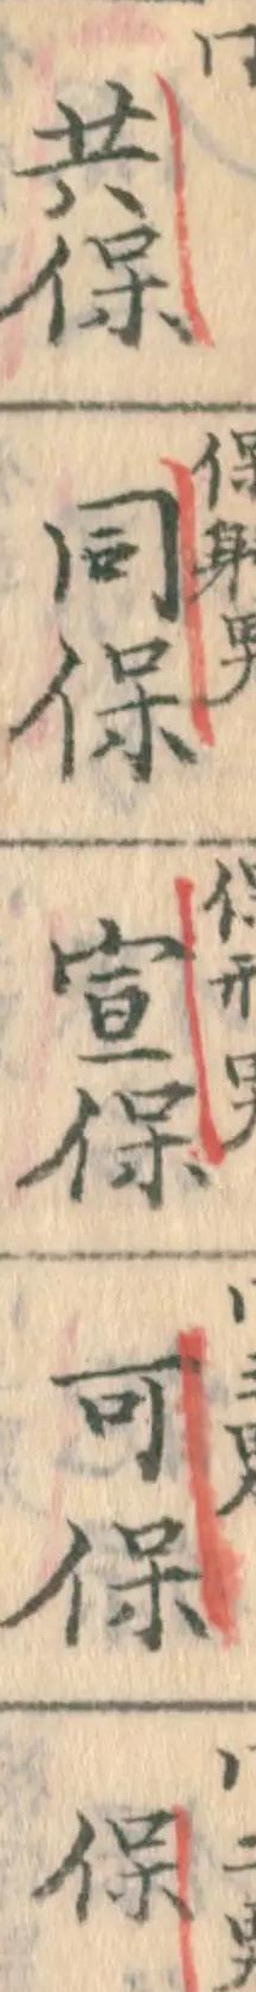共保同保宣保可保保
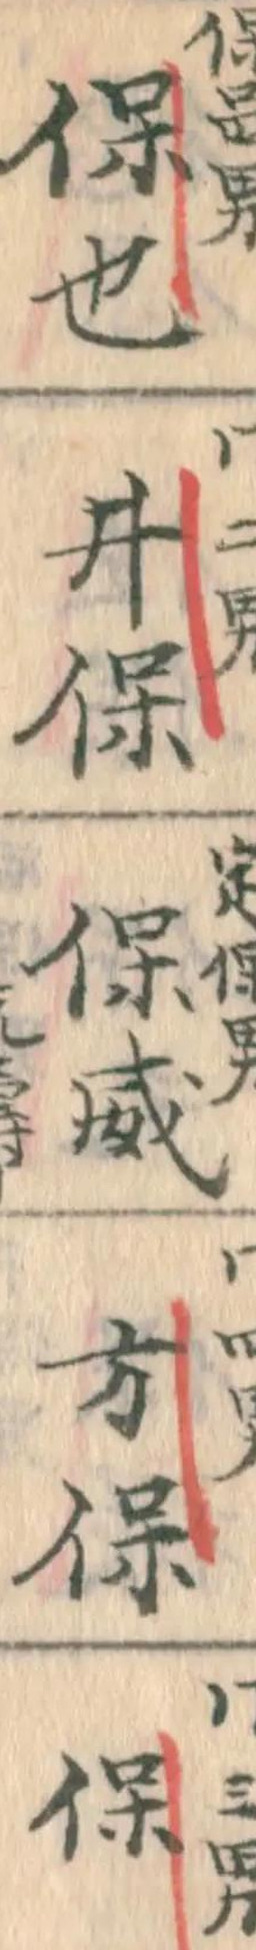保也井保保威方保保
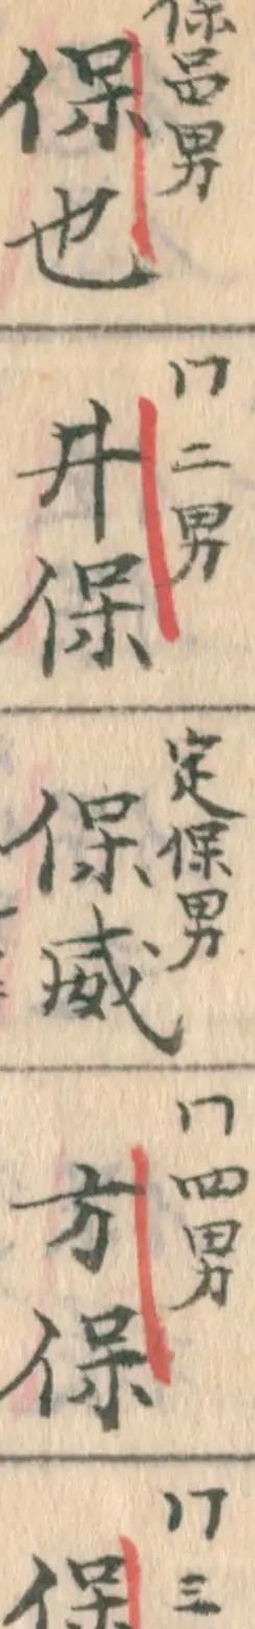保也井保保威方保保
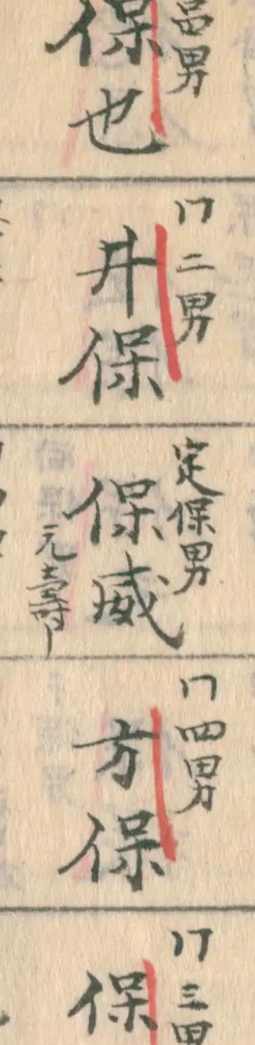保也井保保威方保保
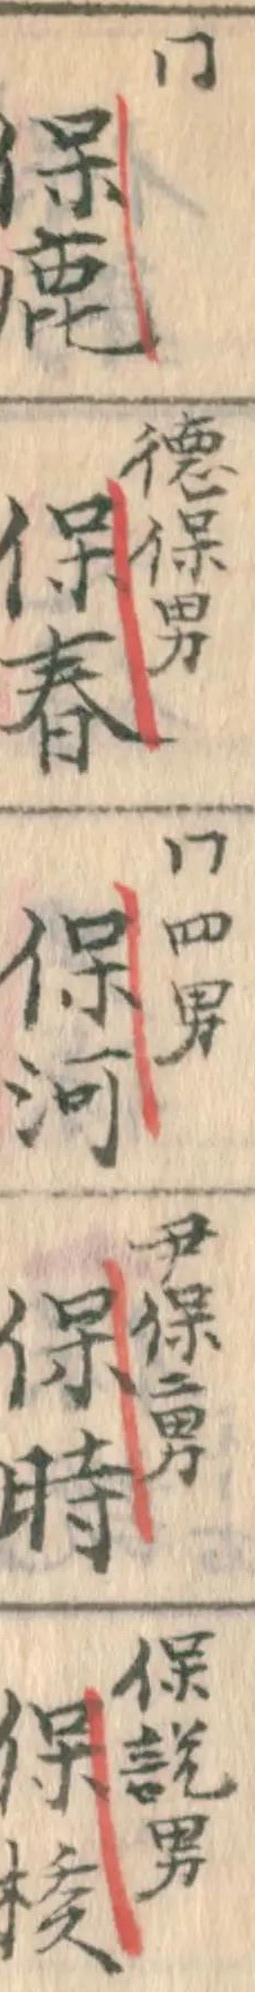保鹿保春保河保時保梭
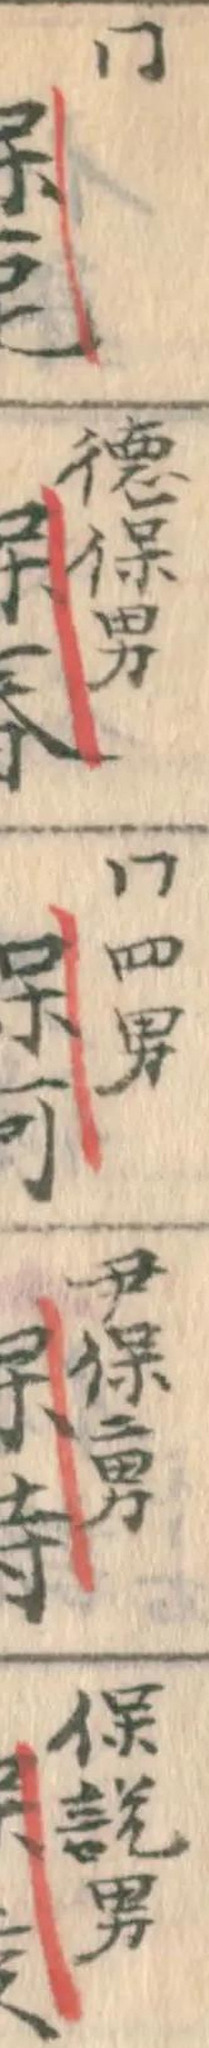同徳保男同四男尹保二男保説男
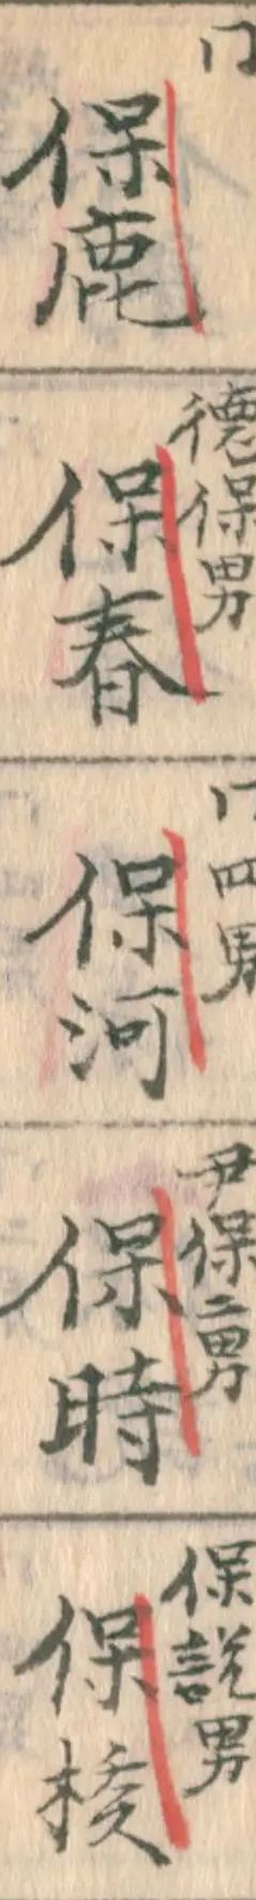保鹿保春保河保時保梭
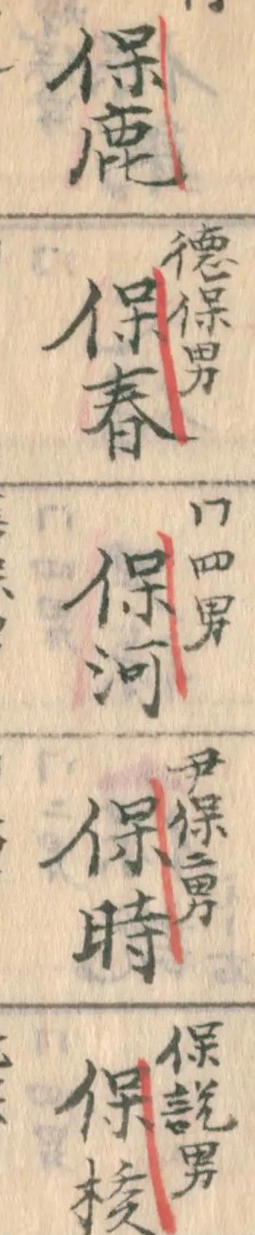保鹿保春保河保時保梭
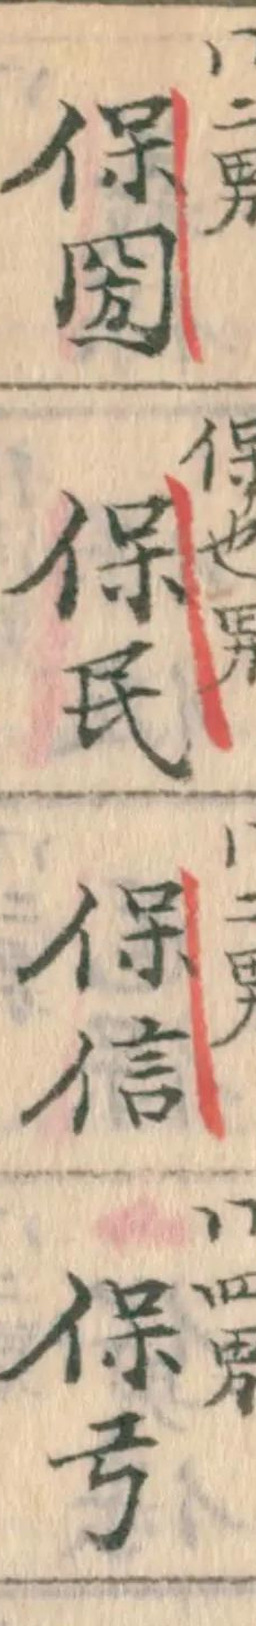保国保民保信保弓
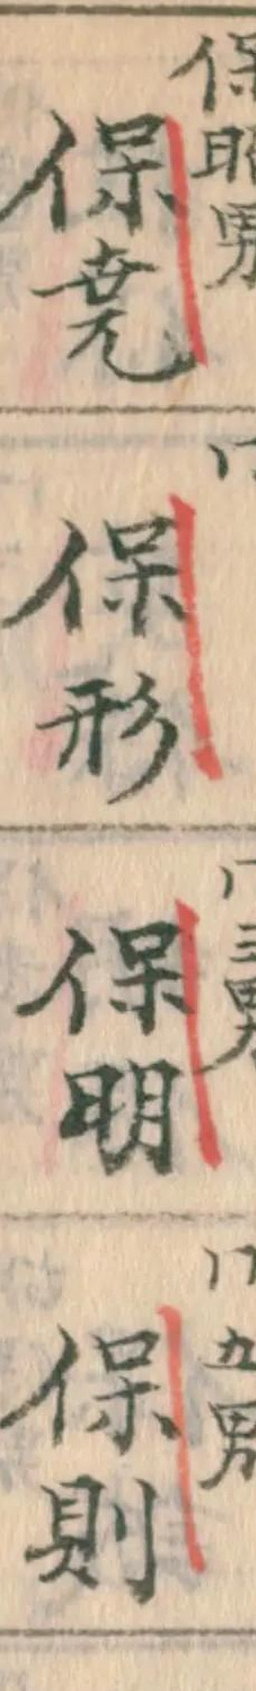保尭保形保明保則
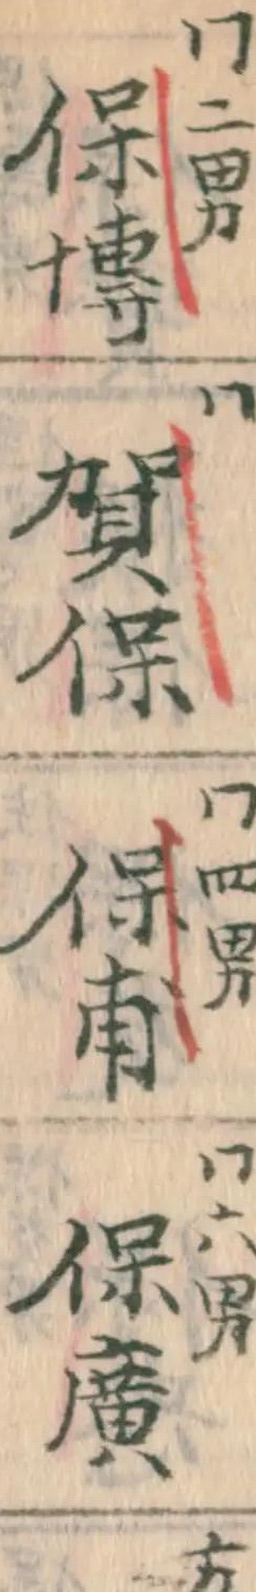保博賀保保甫保広
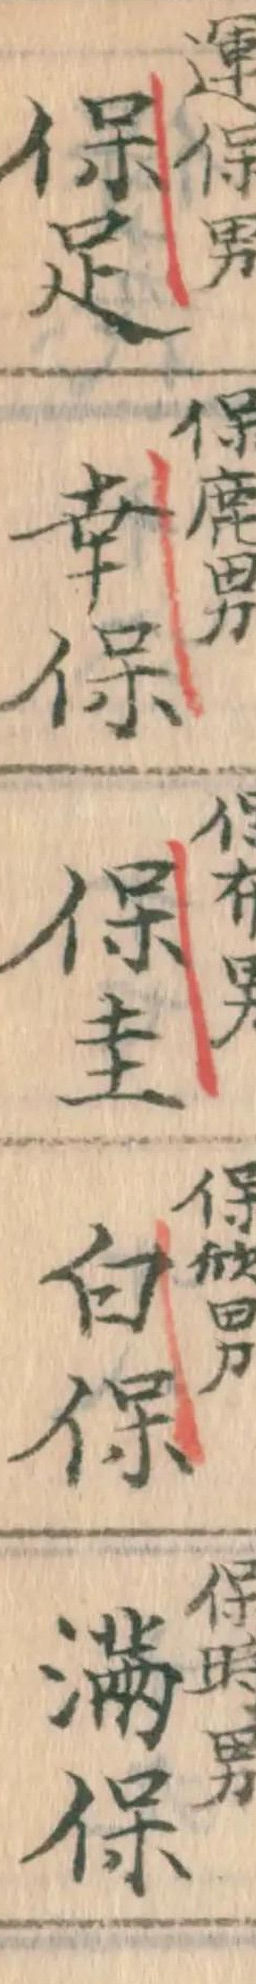保足幸保保圭白保満保
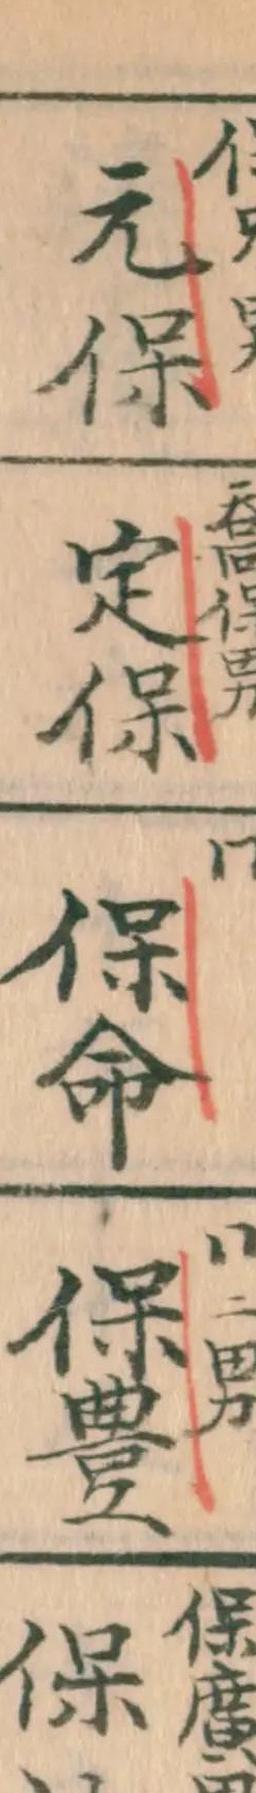元保定保保命保豊保佑

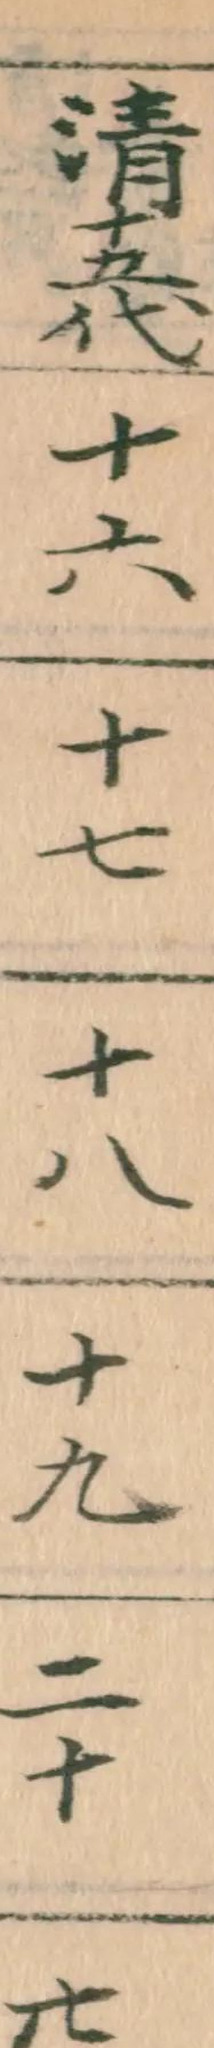清十五代十六十七十八十九二十廿一
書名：賀茂社記録. 第24冊
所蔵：国立国会図書館 National Diet Library, JAPAN
